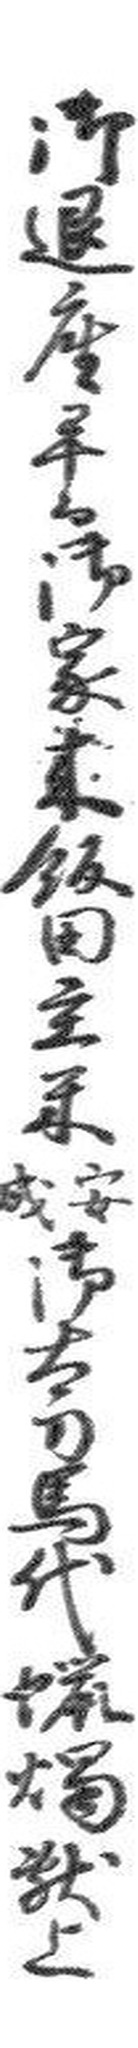御退座畢而御家来飯田主米安成御太刀馬代蠟燭献上
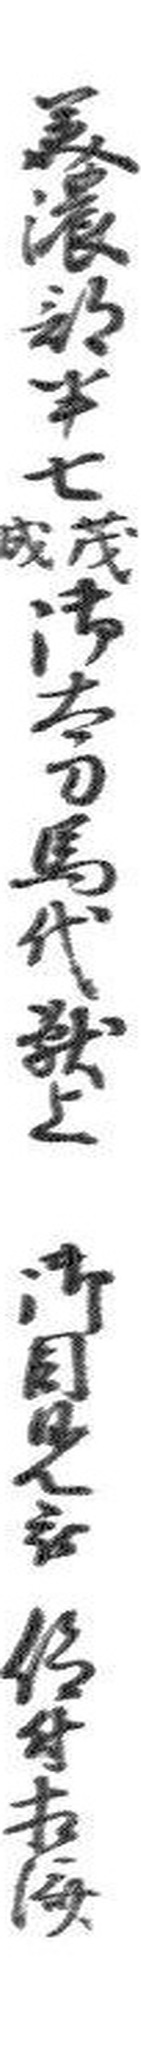美濃部半七茂成御太刀馬代献上御目見被仰付相済
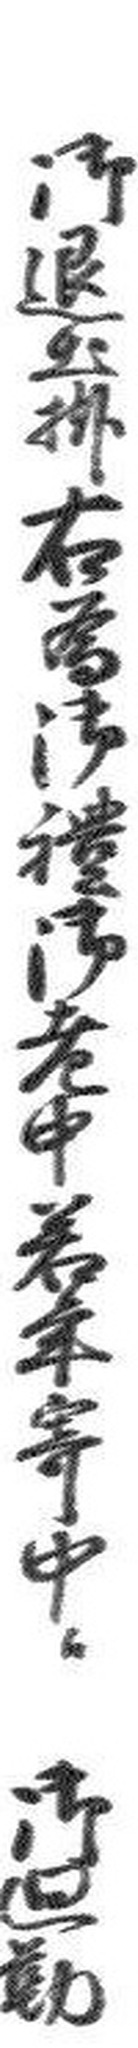御退出掛右為御礼御老中若年寄中江御廻勤
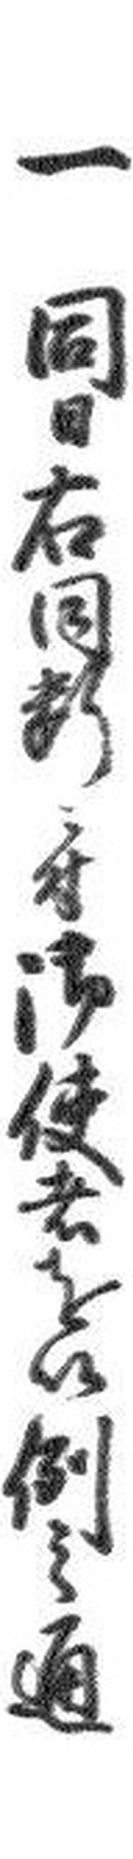一同日右同断ニ付御使者を以例之通
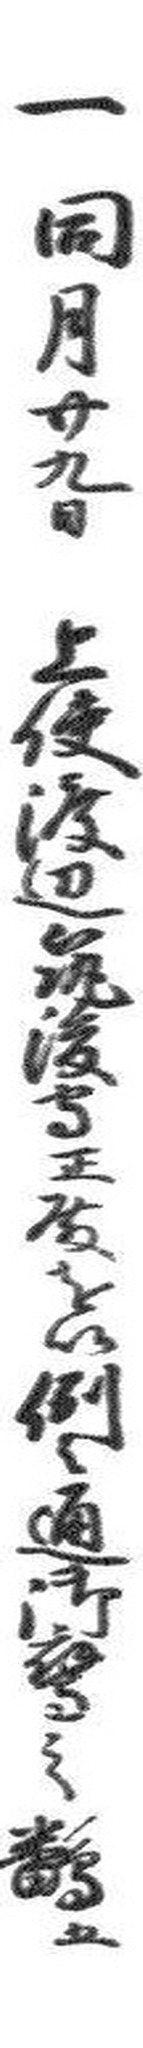一同月廿九日上使渡辺筑後守正殿を以例之通御鷹之鷭五

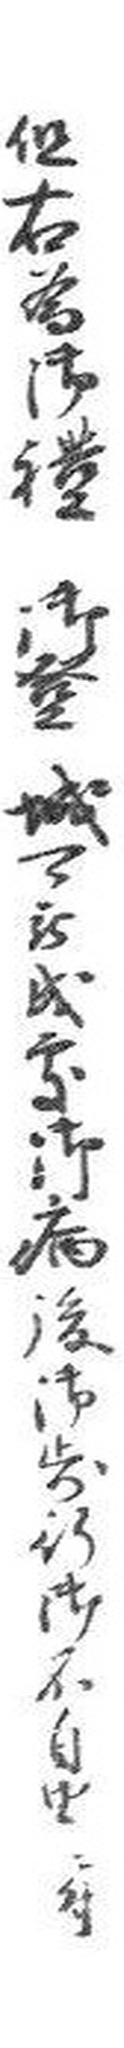但右為御礼御登城可被成処御病後御歩行御不自由ニ付
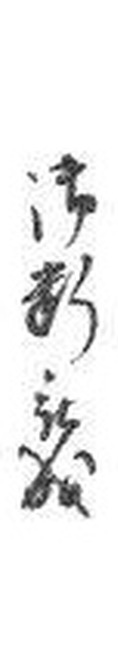御断被成
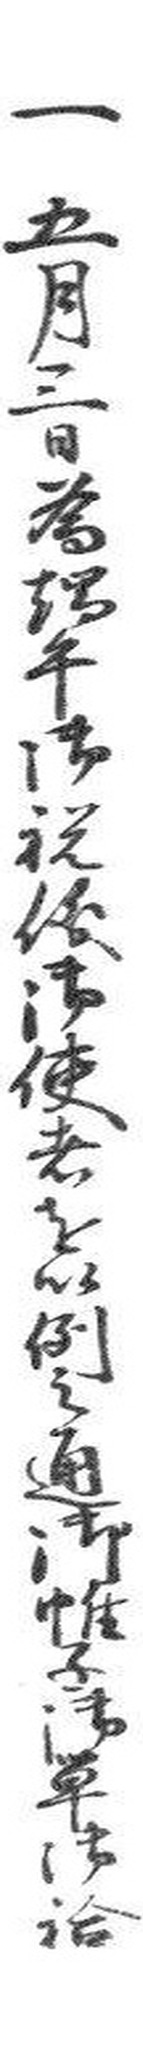一五月三日為端午御祝儀御使者を以例之通御帷子御単御袷
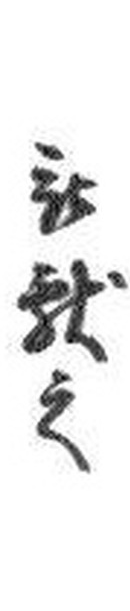被献之
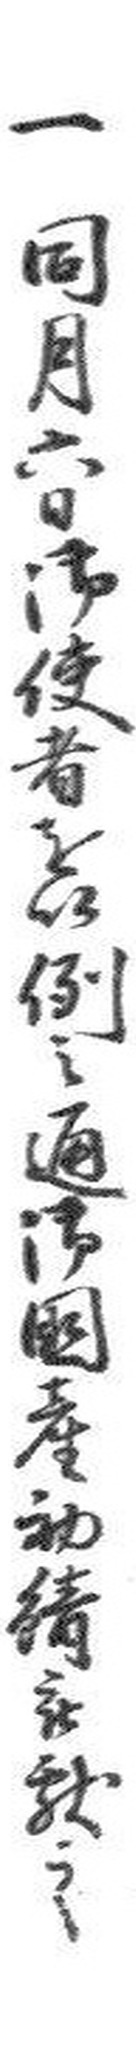一同月六日御使者を以例之通御国産初鯖被献之
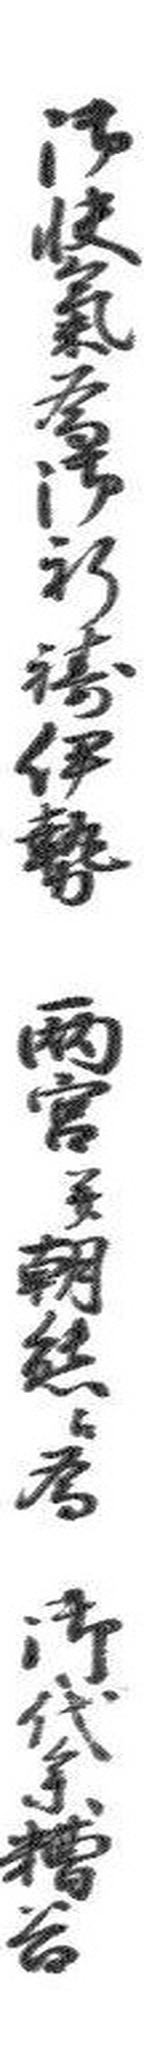御快気為御祈祷伊勢両宮并朝熊江為御代参糟谷
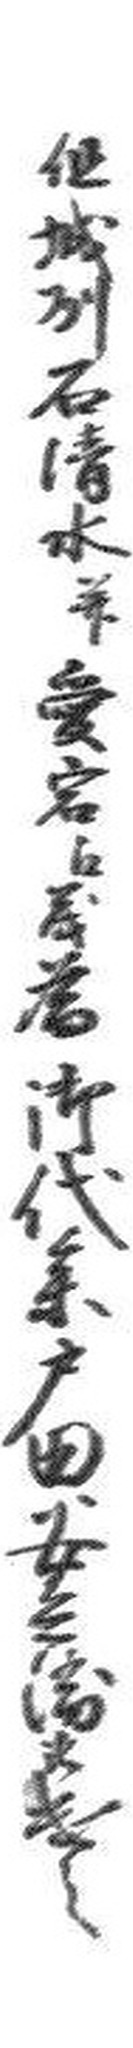但城州石清水并愛宕江も為御代参戸田安兵衛被遣之
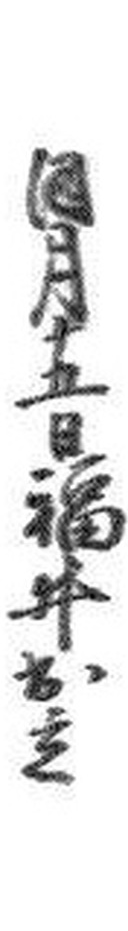同月十五日福井出立
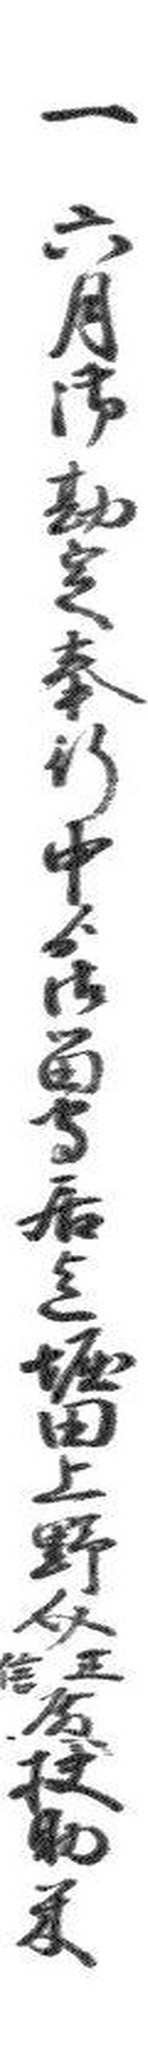一六月御勘定奉行中ゟ御留守居迄堀田上野介正信殿扶助米
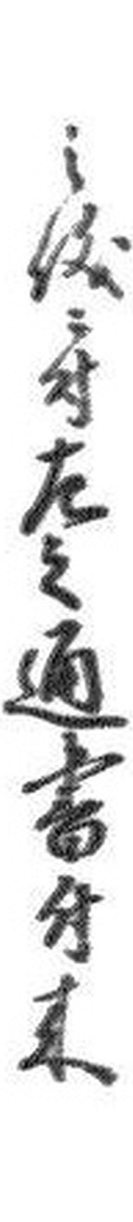之儀ニ付左之通書付来
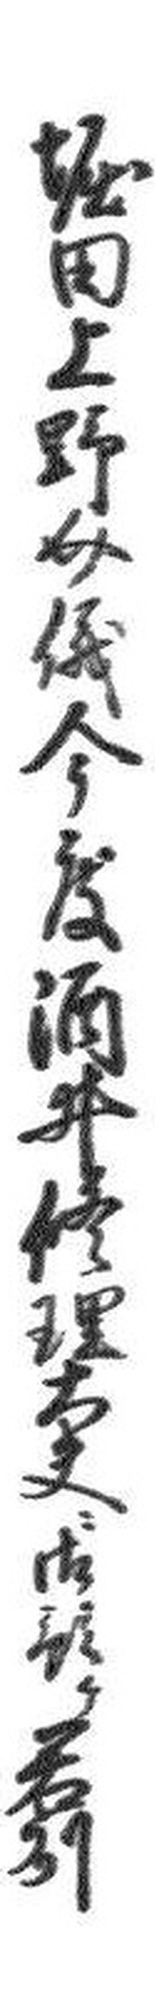堀田上野介儀今度酒井修理大夫ニ御預ケ若州
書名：家譜 八 光通公 従寛文十年到同十二年
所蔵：福井県文書館 Fukui Prefectural Archives
